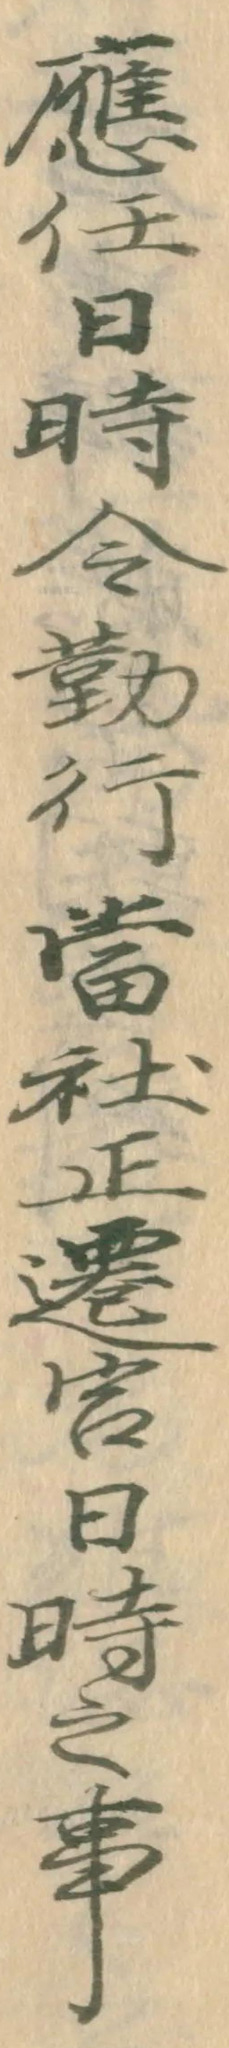応任日時令勤行当社正遷宮日時之事
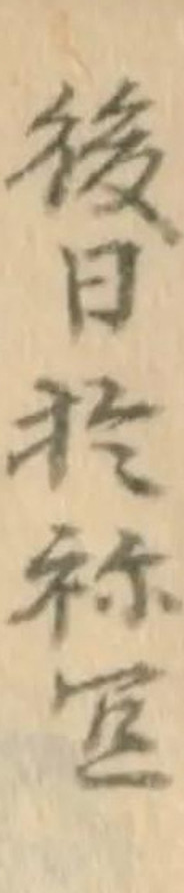後日於祢宜
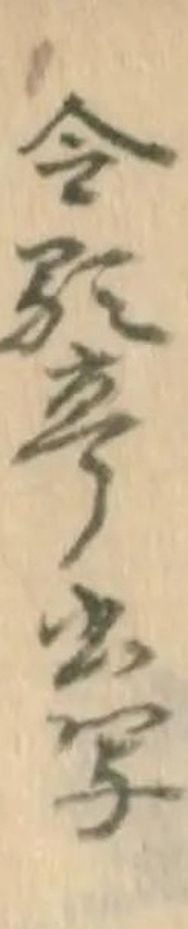令顕亭書写
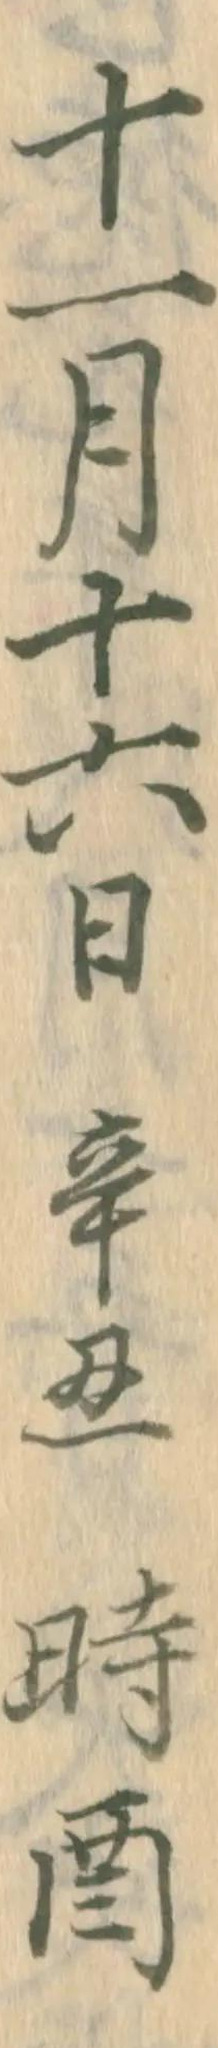十一月十六日辛丑時酉
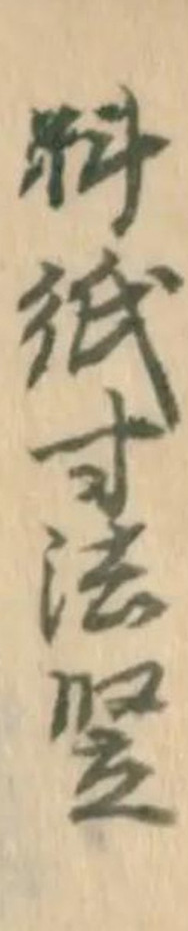料紙寸法竪
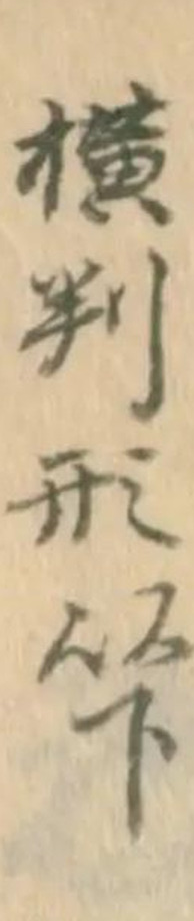横判形以下
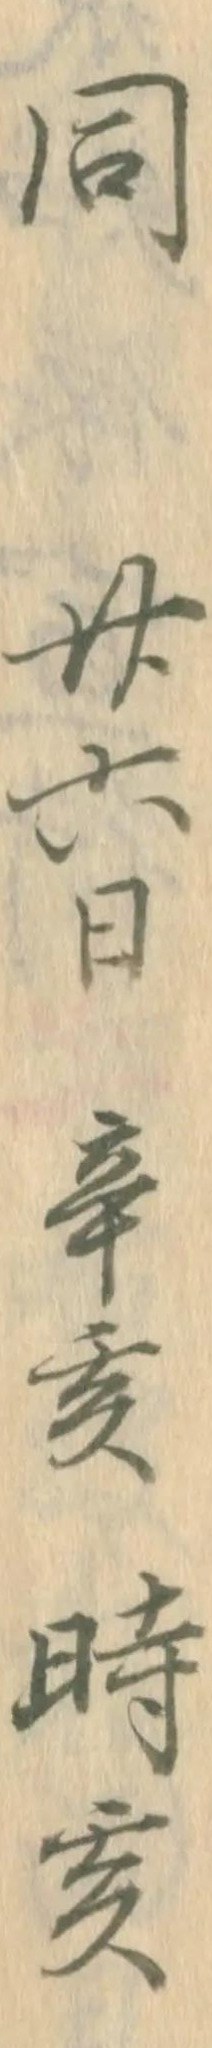同廿六日辛亥時亥
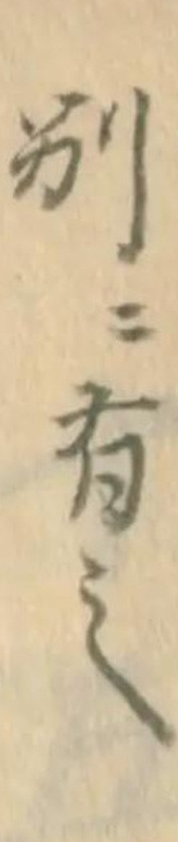別ニ有之
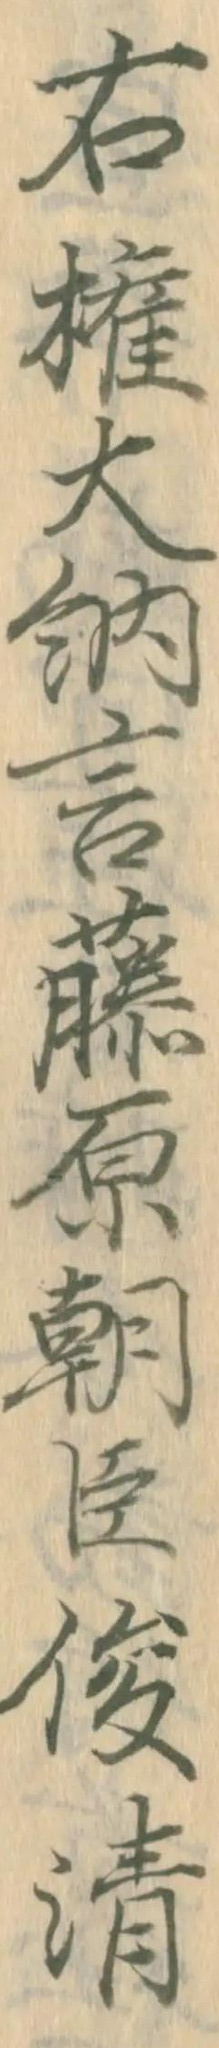右権大納言藤原朝臣俊清

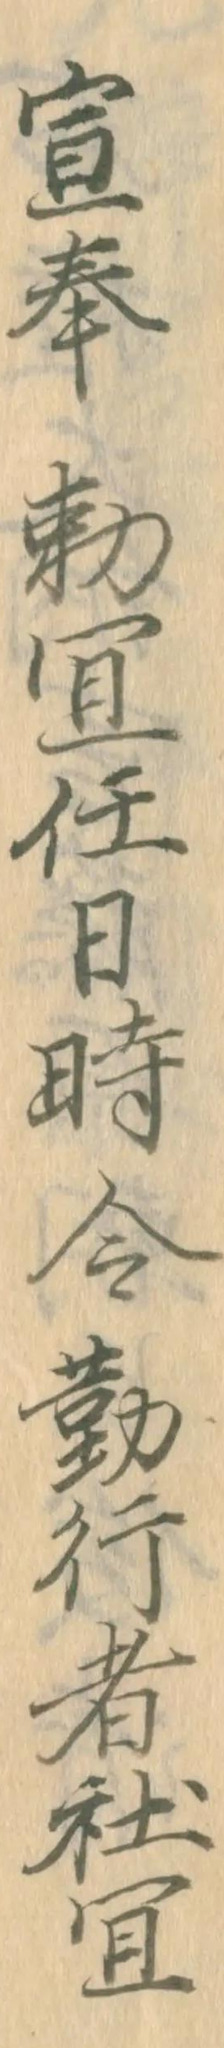宣奉勅宜任日時令勤行者社宜
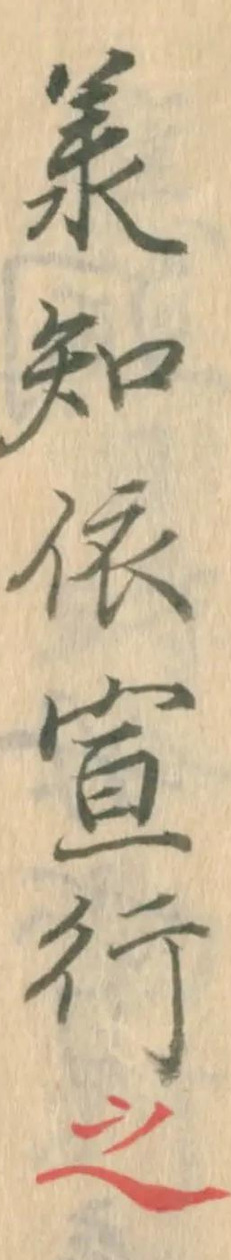承知依宣行之
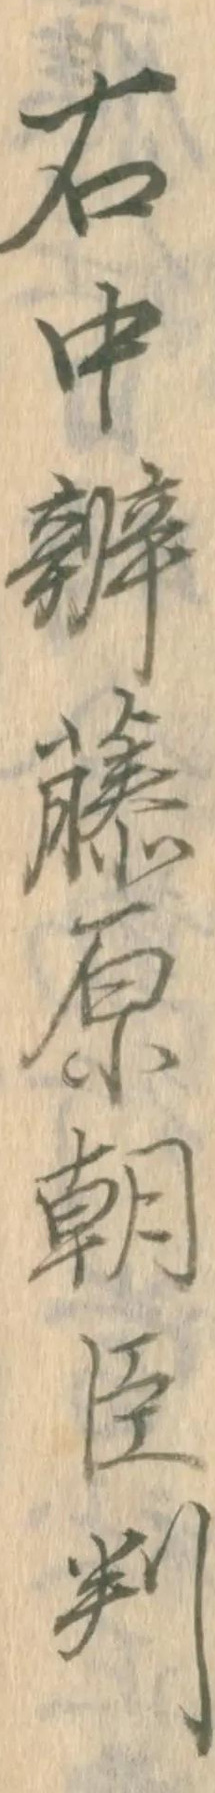右中弁藤原朝臣判
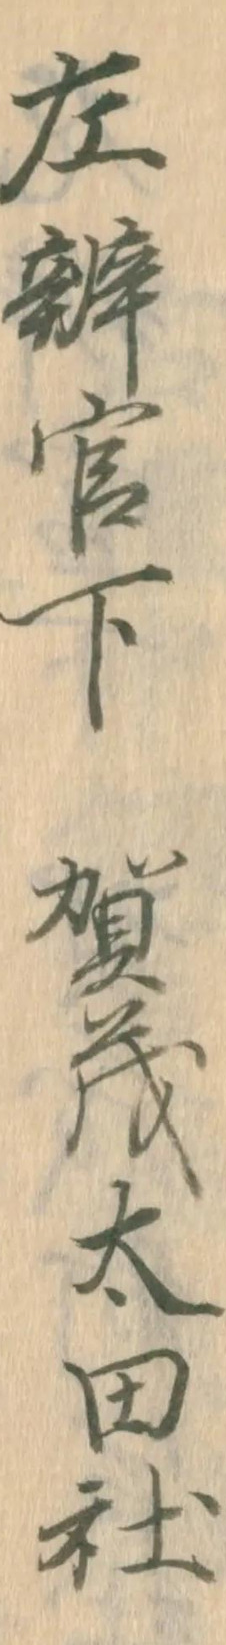左弁官下賀茂太田社
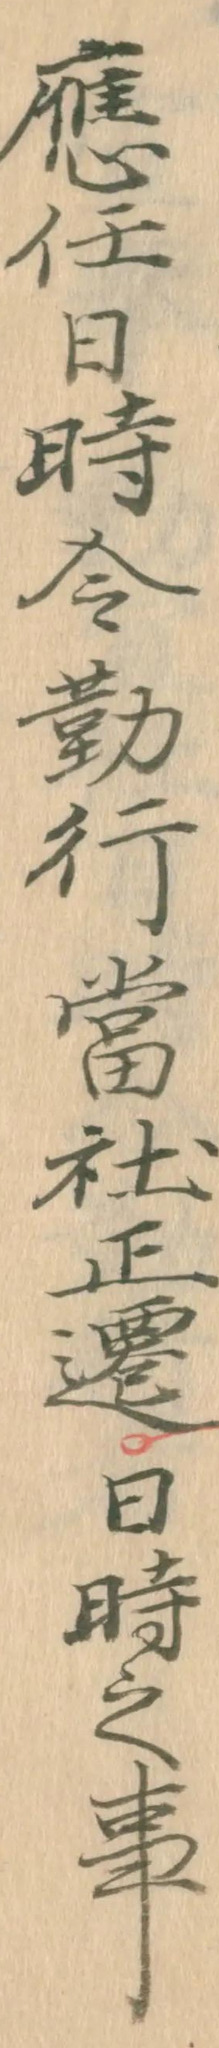応任日時令勤行当社正遷￮日時之事
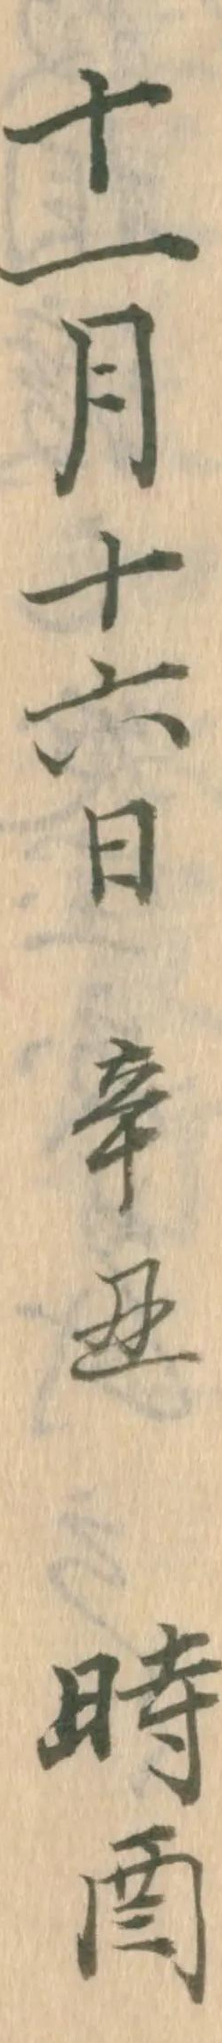十一月十六日辛丑時酉
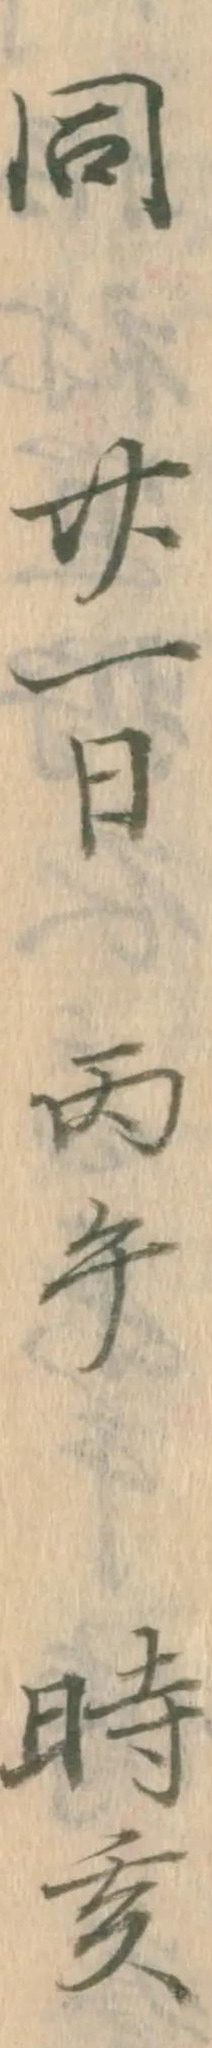同廿一日丙午時亥
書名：賀茂社記録. 第16冊
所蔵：国立国会図書館 National Diet Library, JAPAN
